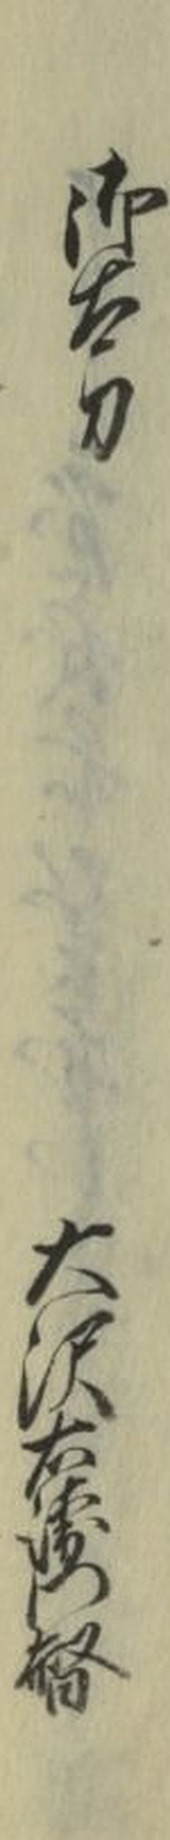御太刀大沢右衛門督
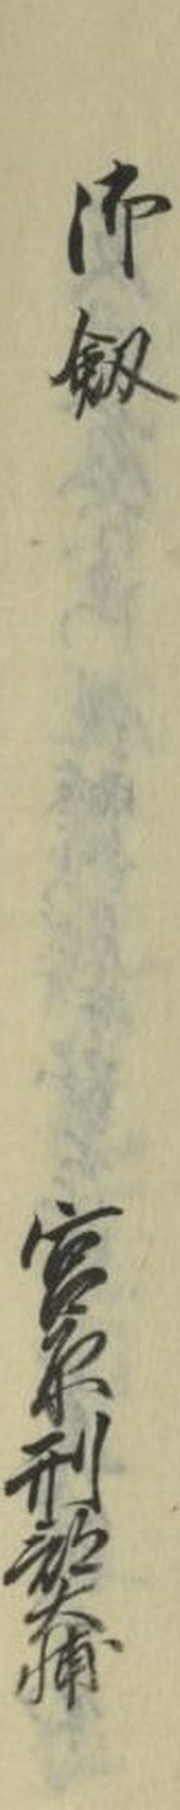御釼宮原刑部大輔
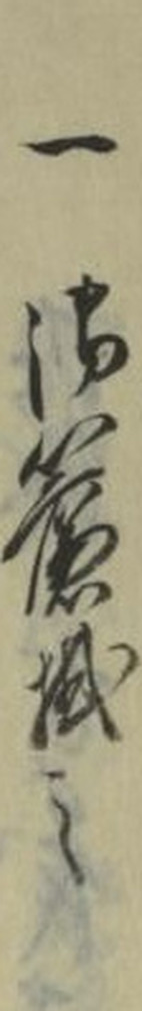一御簾掛之
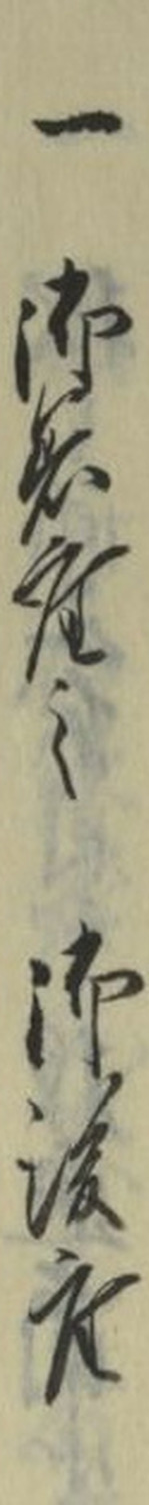一御着座之御御座
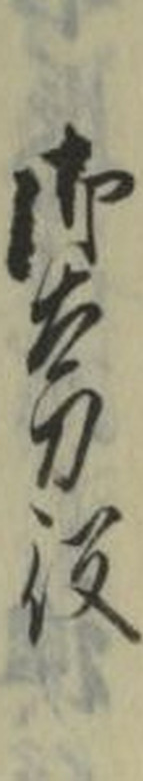御太刀役
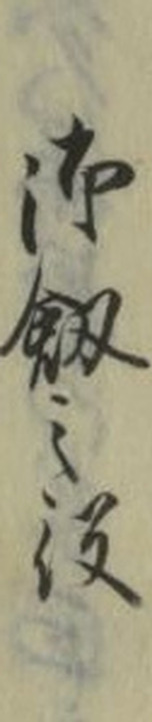御釼之役
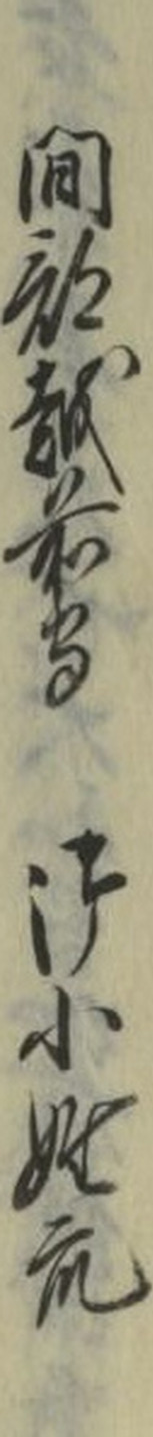間部越前守御小姓衆
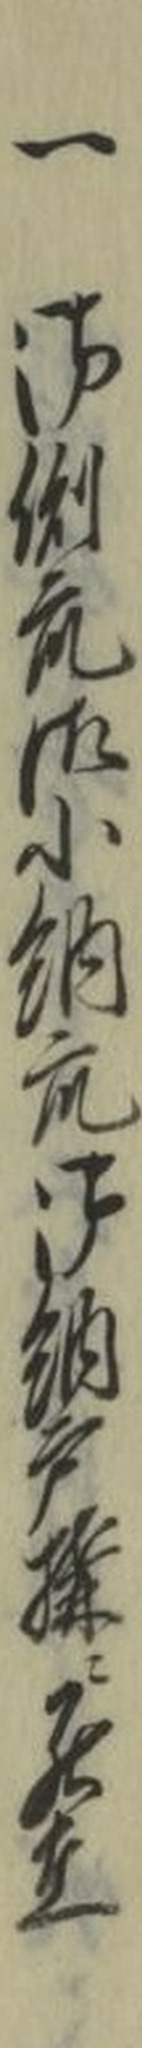一御側衆御小納衆御納戸構に罷在
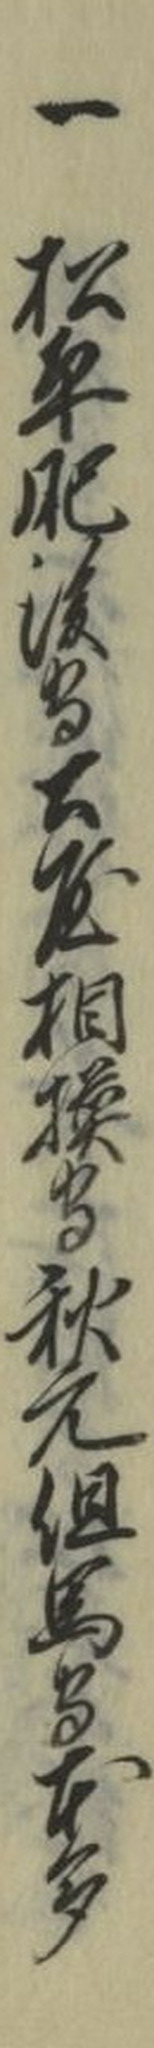一松平肥後守土屋相模守秋元但馬守本多

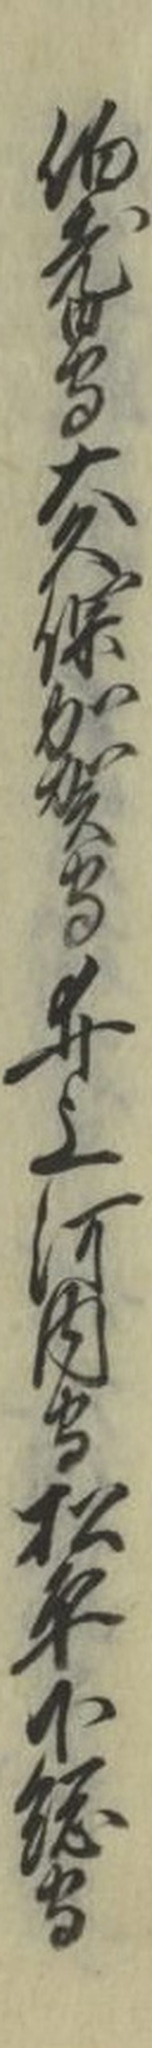伯耆守大久保加賀守井上河内守松平下総守
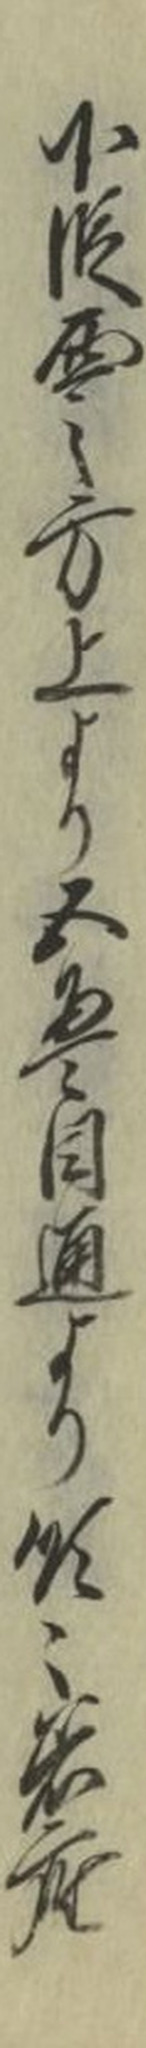下段西之方上より五畳目通より順々着座
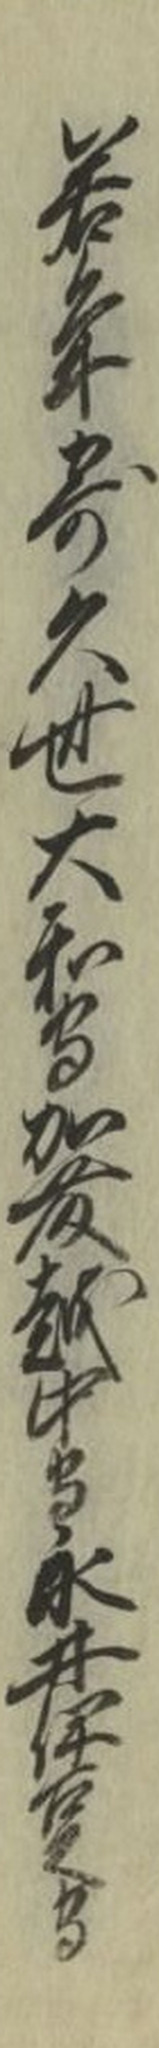一若年寄久世大和守加藤越中守永井伊豆守
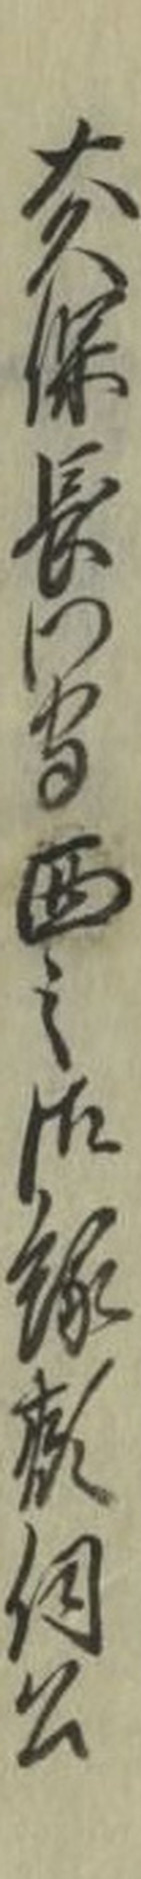大久保長門守西之御縁頬伺公
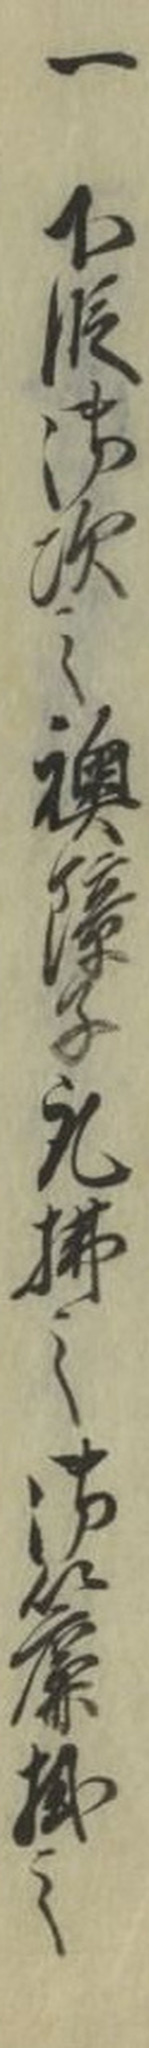一下段御次之襖障子取払之御簾掛之
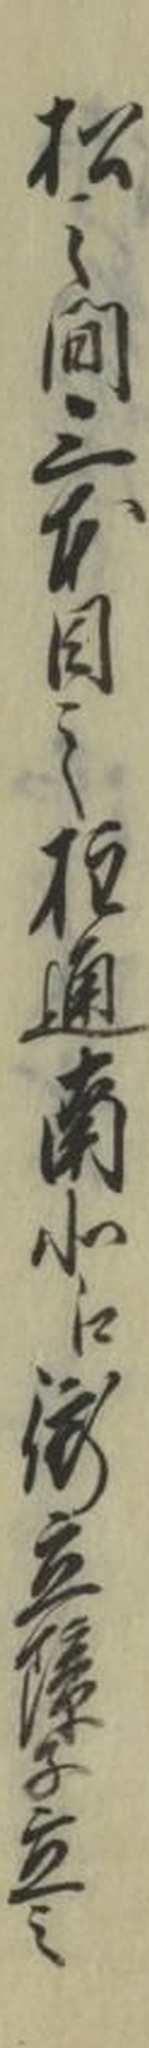松之間三本目之柱通南北え衝立障子立之
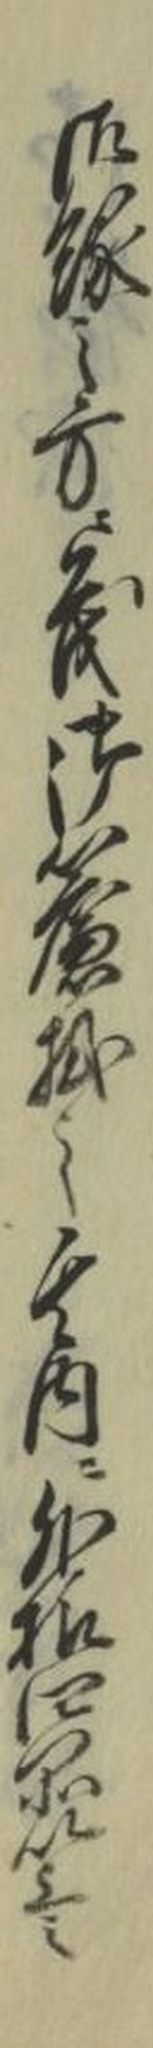御縁之方にも御簾掛之其内に外様四品以上之
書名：琉球人参府記
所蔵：University of the Ryukyus Library
